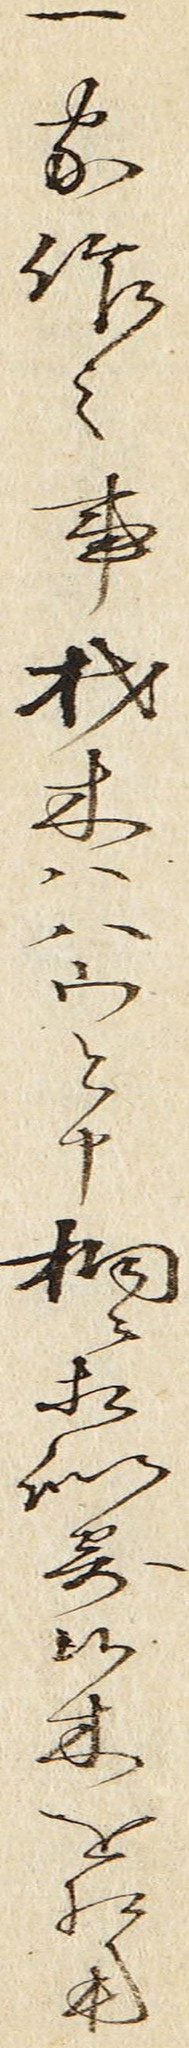一家作之事伐木はハウと申桐に相似寄候木を相用
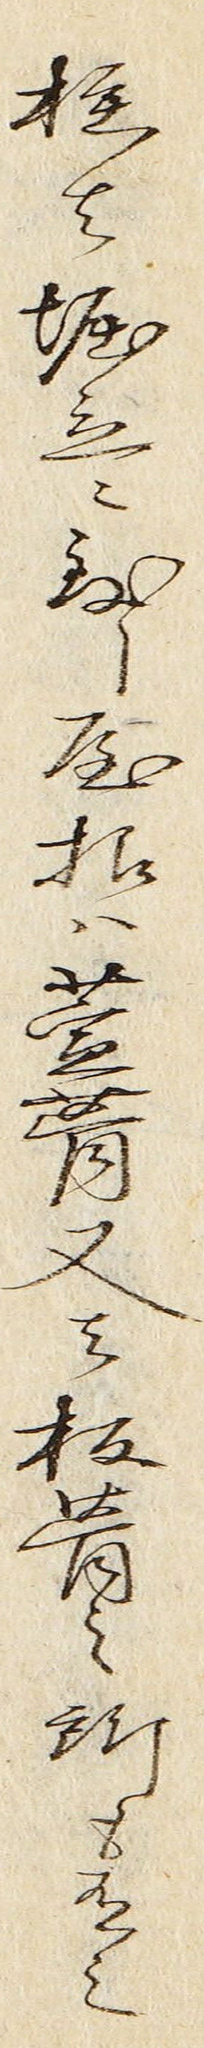柱は掘立に致し屋根は萱葺又は板葺之所も有之
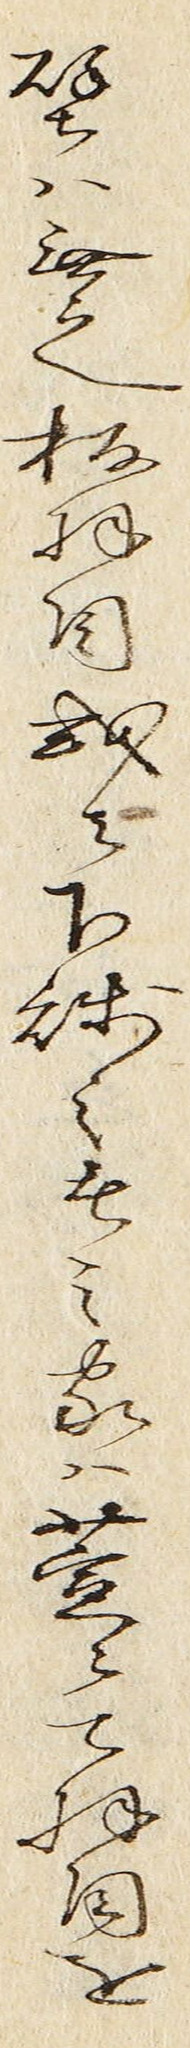壁は無之板羽目或は下賤之者之家は萱にて羽目を
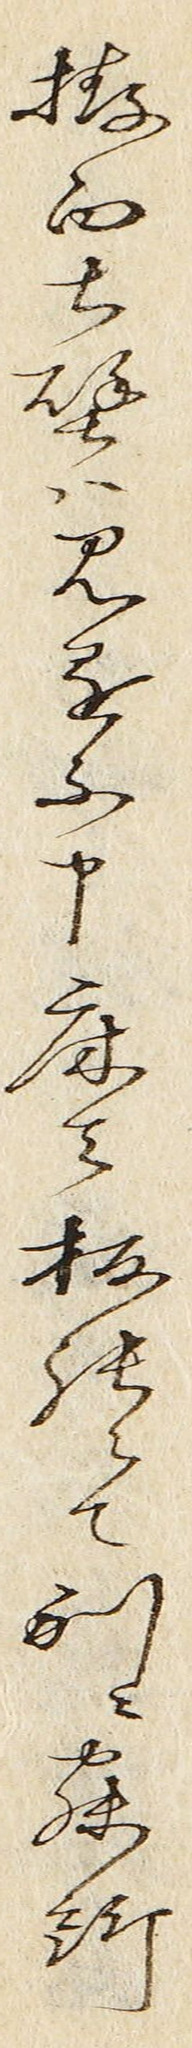拵白土壁は見懸不申床は板張にて別に寝所
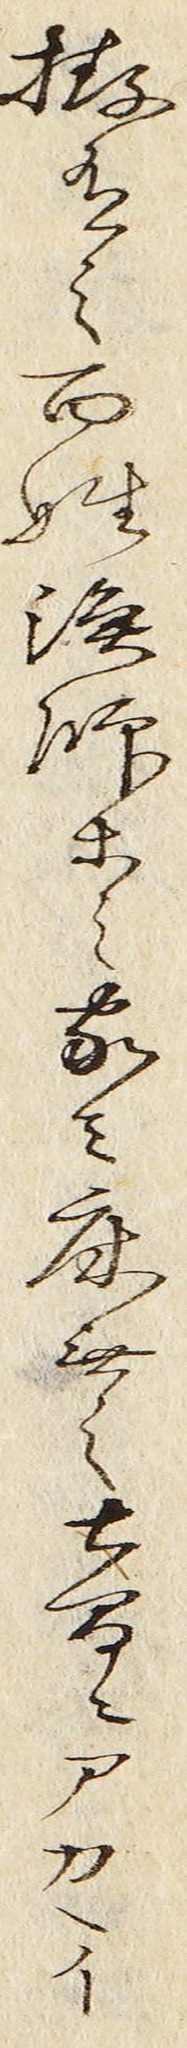拵有之百姓漁師等之家は床無之土間にアカヽイ
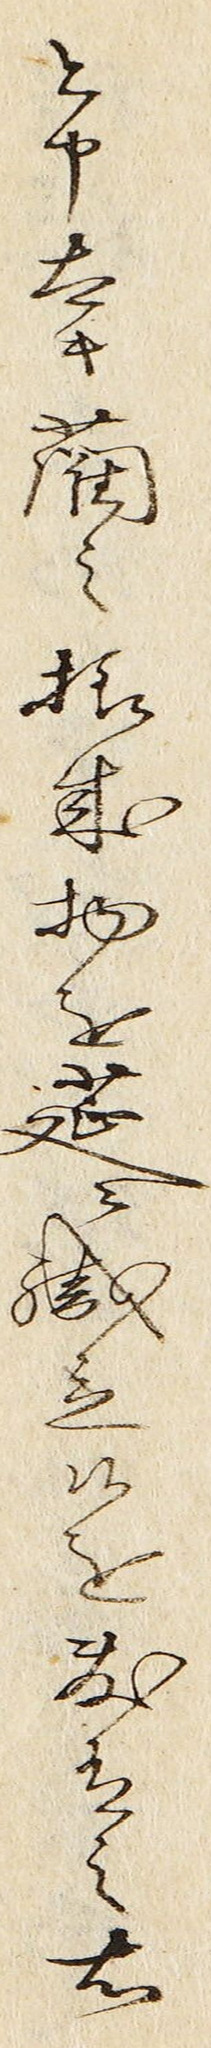と申太き藺之様成物を莚に織立候を敷有之右
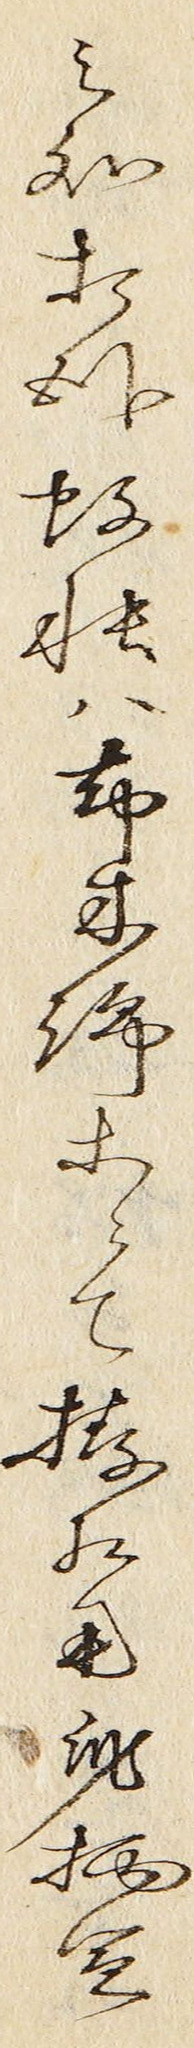之処相臥蚊帳は布木綿等にて拵相用身柄宜
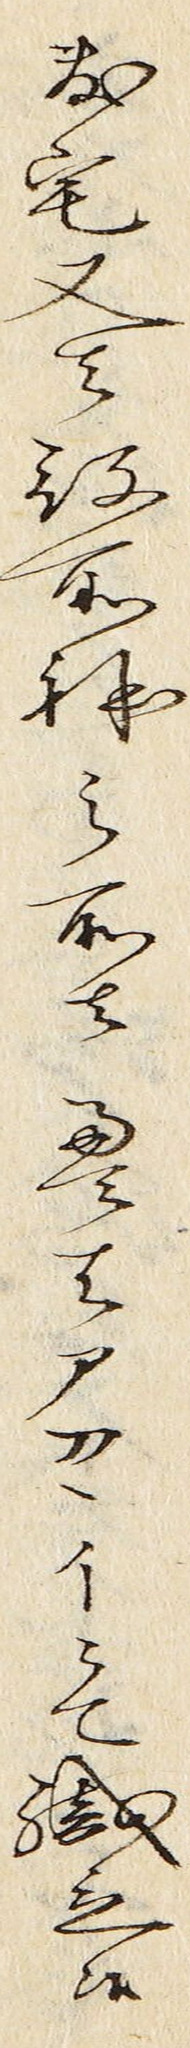敷宅又は役所躰之所は畳はアカヽイにて織立候
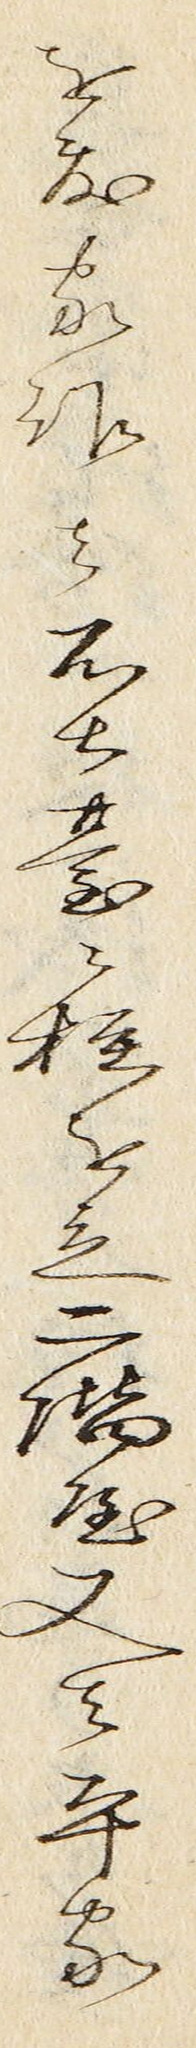を敷家作は石土台に柱を立二階屋又は平家
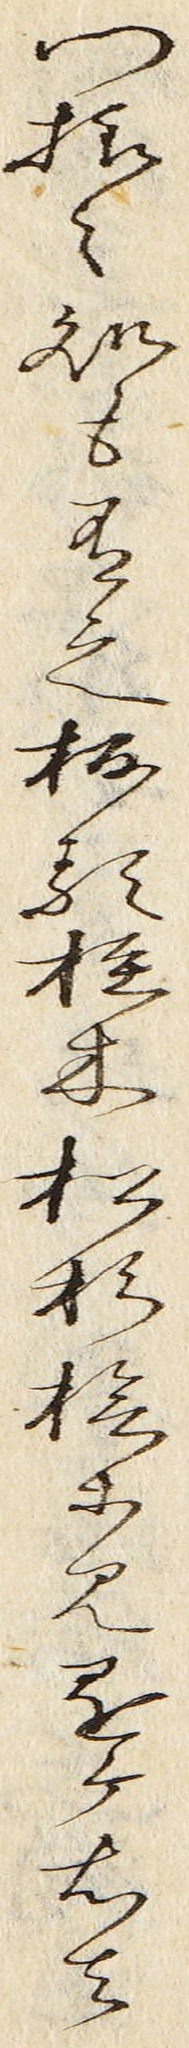門様之処も有之板類柱木松杉桧等見懸右は
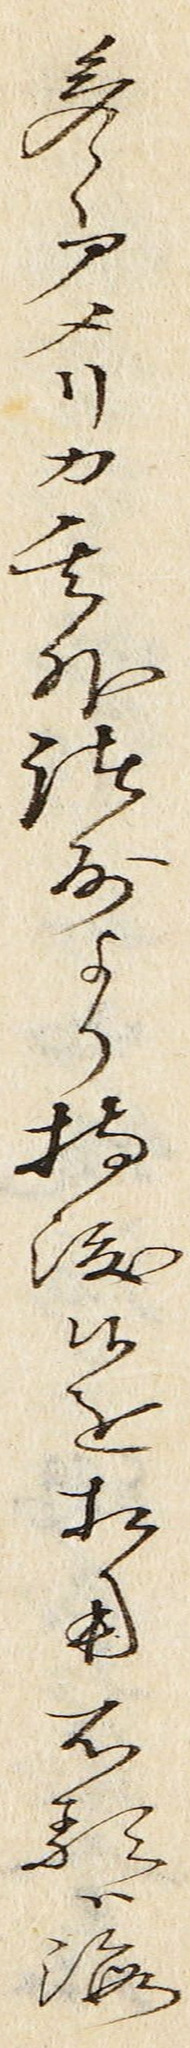多くアメリカ其外諸州より持渡候を相用石類は海
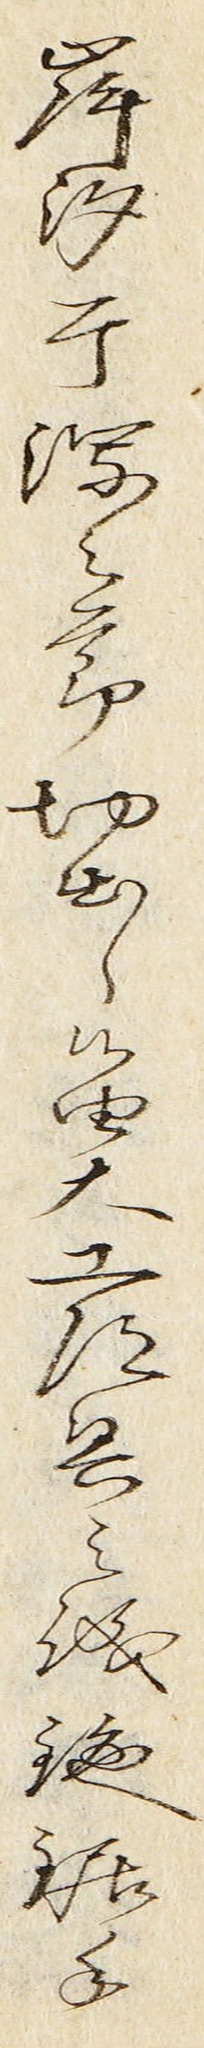岸汐干潟之節切出し候由大工道具之儀鉋鋸手
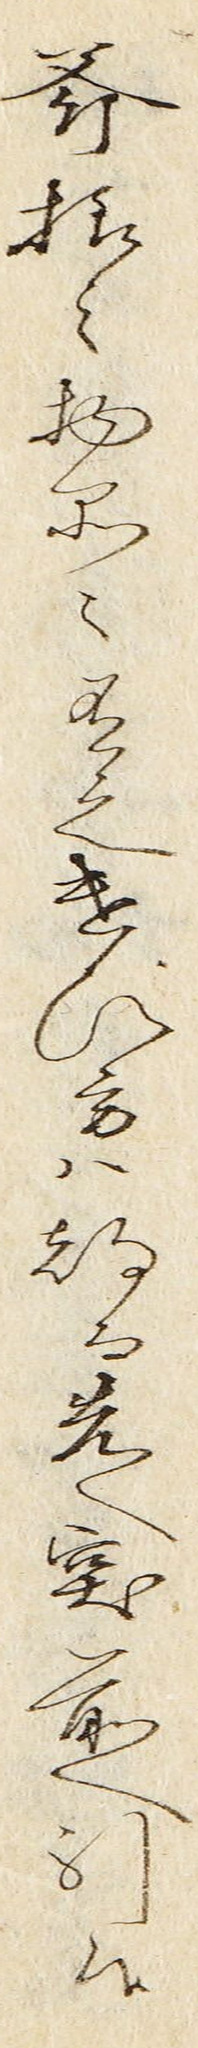斧様之物品々有之遣ひ方は都而先へ突前へ引候
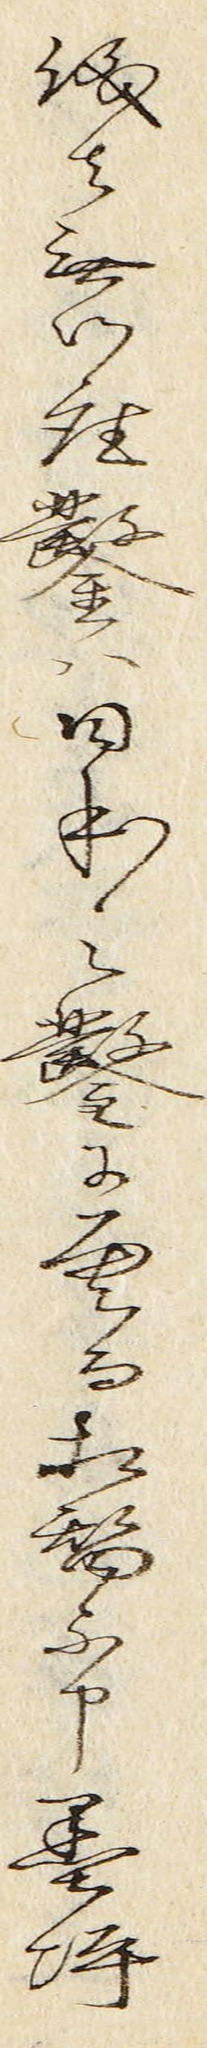儀は無御座鑿は日本之鑿に差而相替不申墨坪
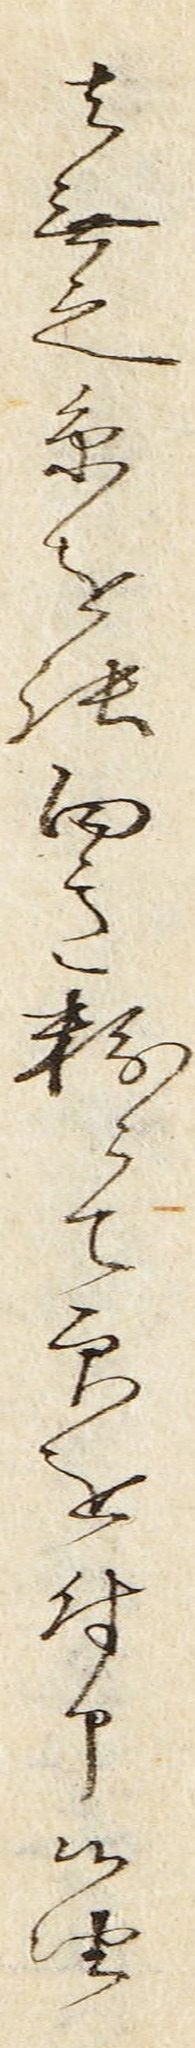は無之糸を張白き粉にて印を付申候由
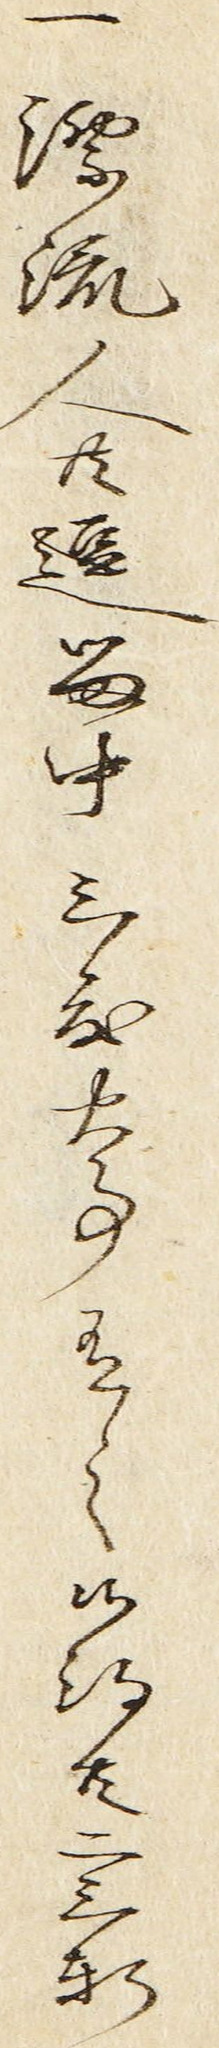一漂流人共逗留中三度火事有之候得共二三軒
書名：土佐中浜万次郎漂流記
